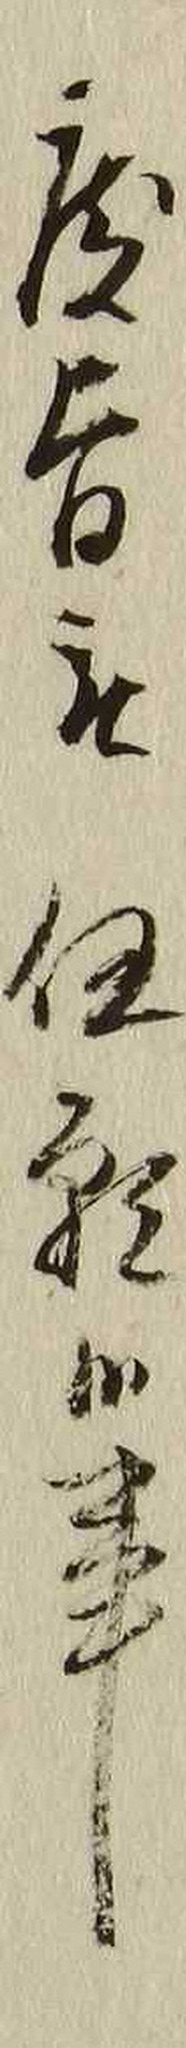度旨被任願候事
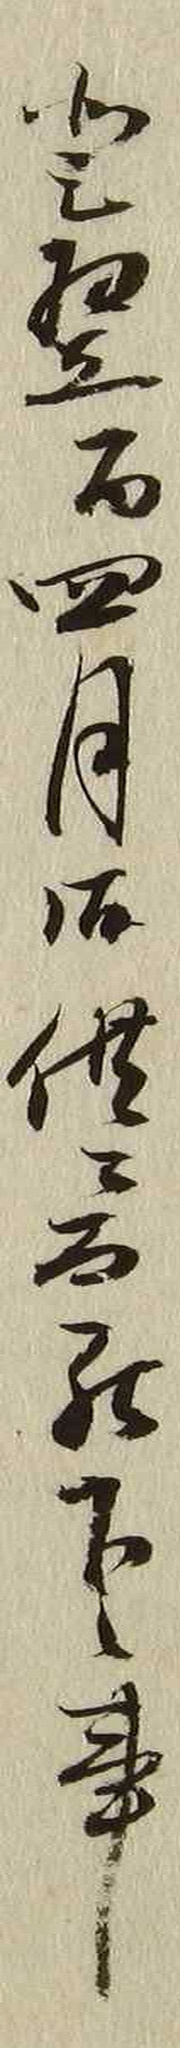登翌酉四月御供ニ而罷下候事
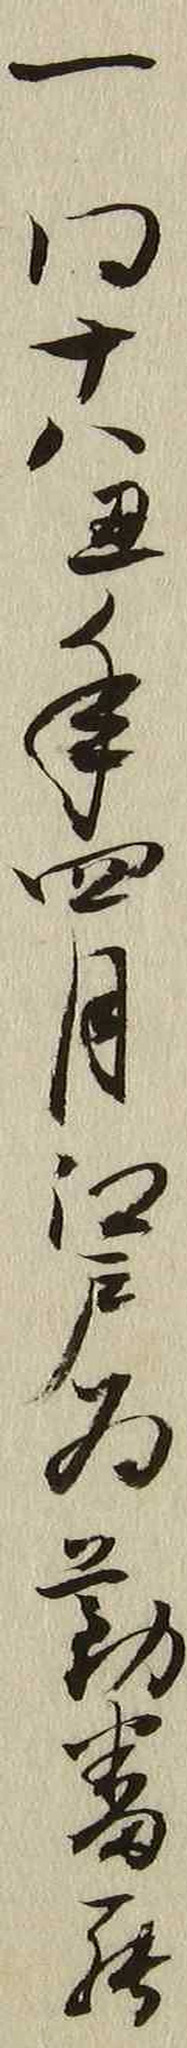一同十八丑年四月江戸為勤番罷
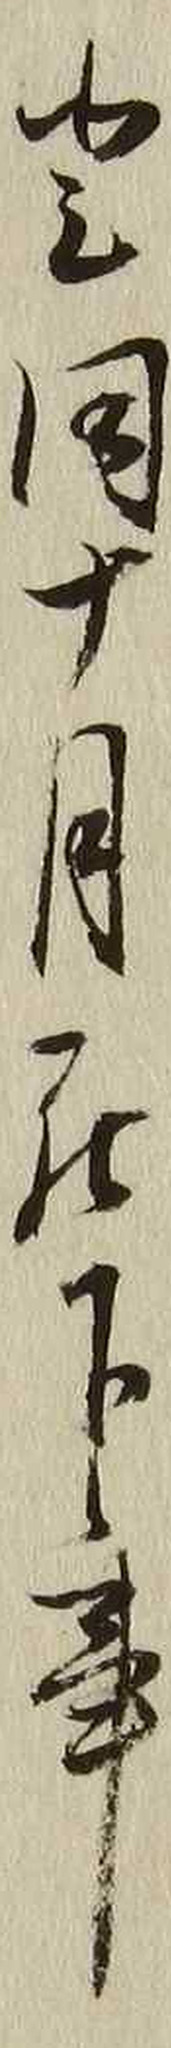登同十月罷下候事
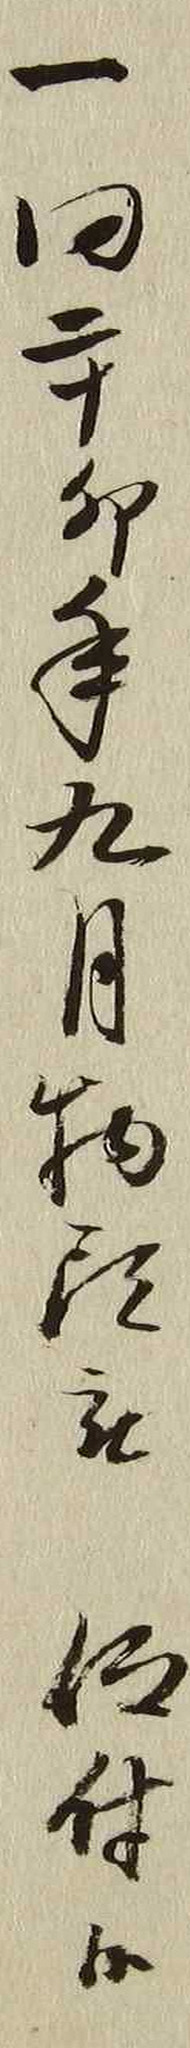一同二十卯年九月物頭被仰付候
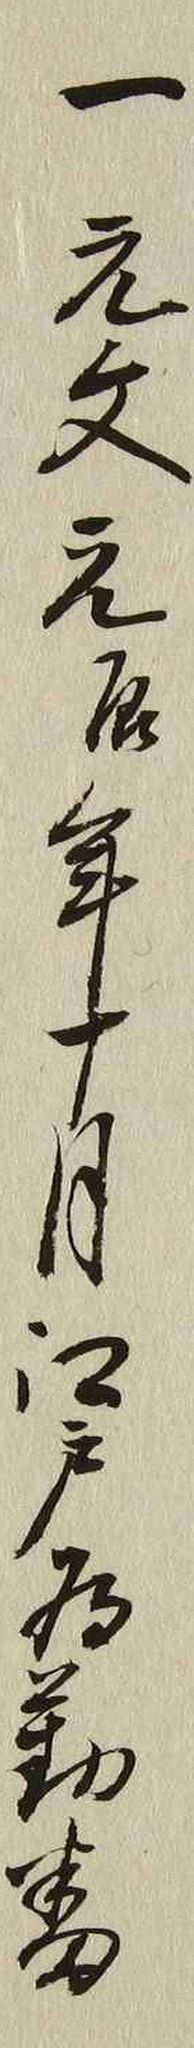一元文元辰年十月江戸為勤番
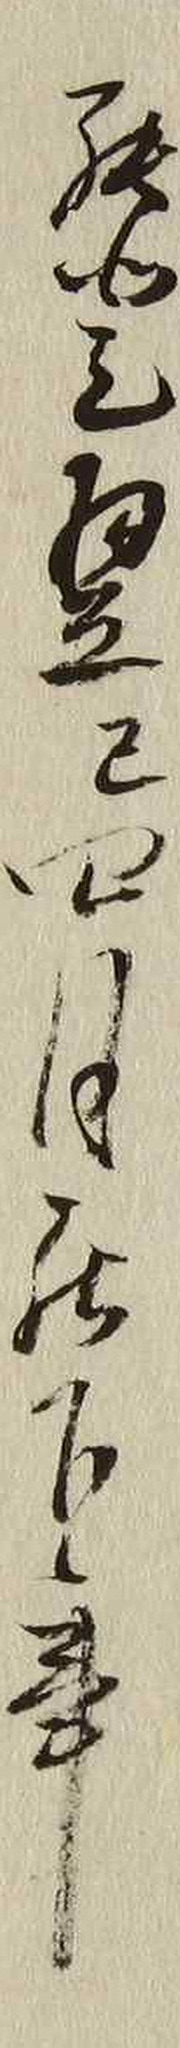罷登翌巳四月罷下候事
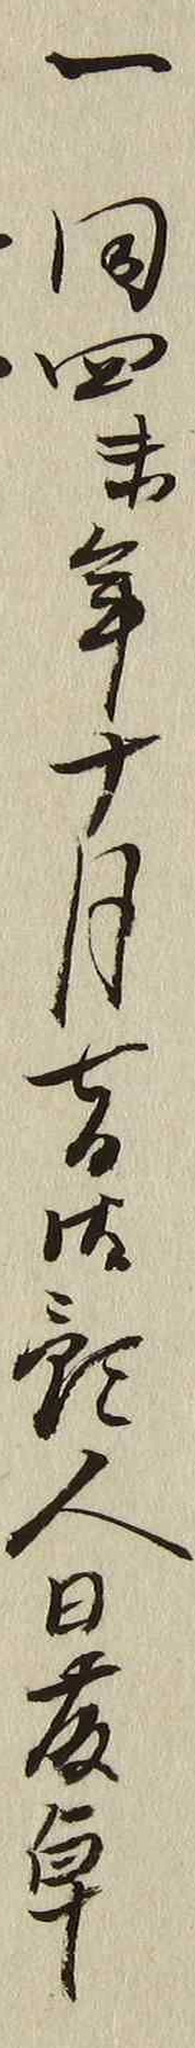一同四未年十月七日御預人日藤卓
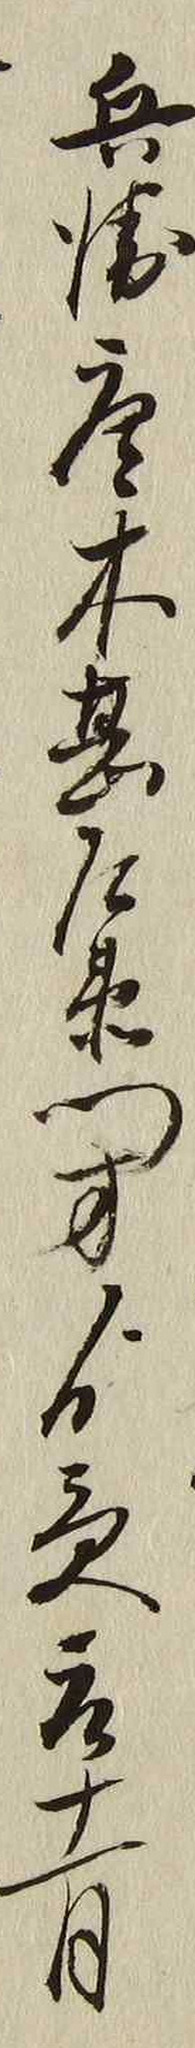兵衛唐木甚左衛門方ゟ受取十一月
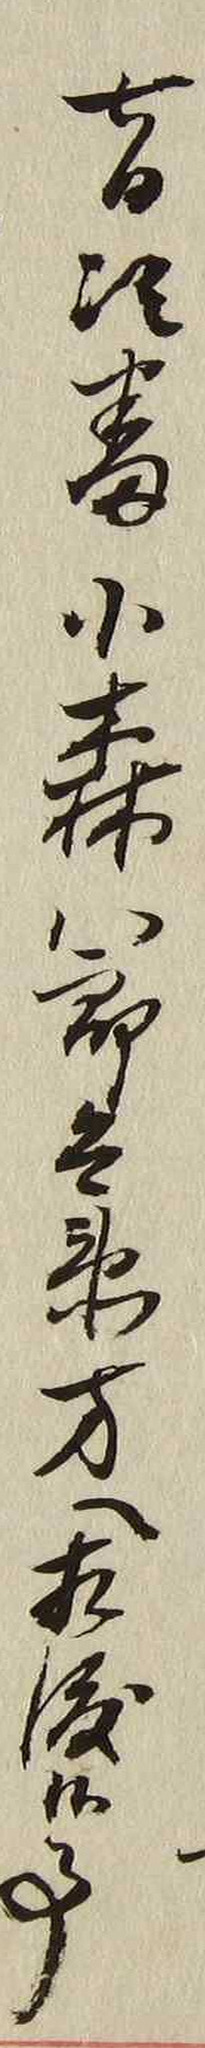七日次番小森八郎兵衛方へ相渡候事
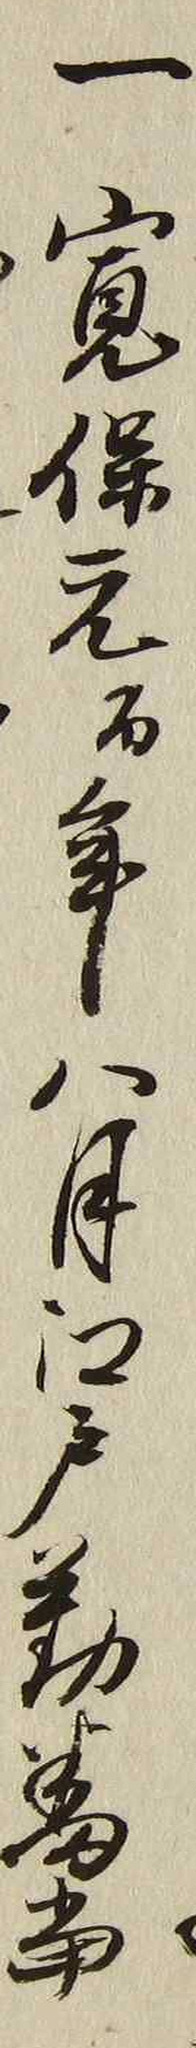一寛保元酉年八月江戸勤番当
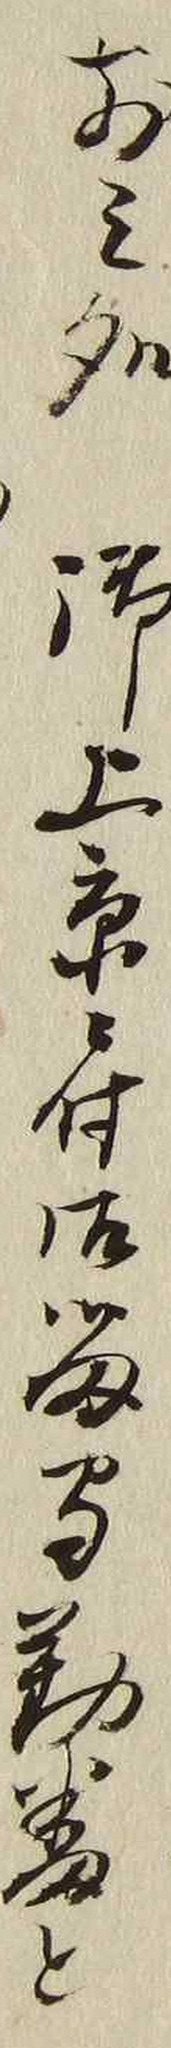前之処御上京ニ付御留守勤番と
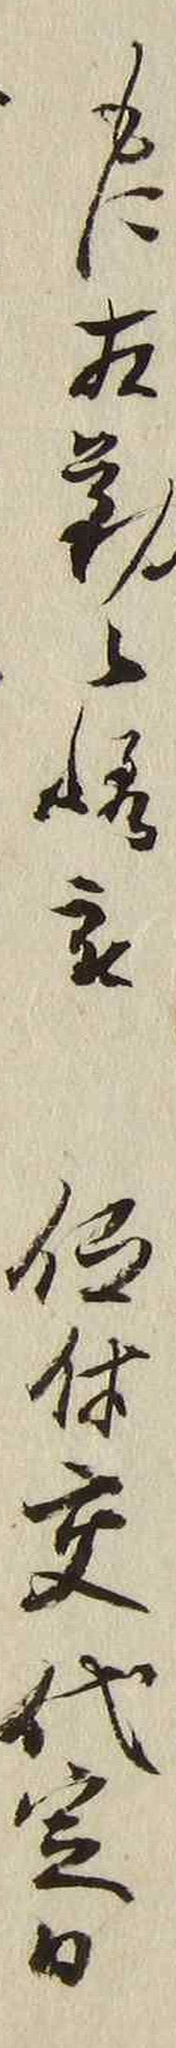もに相勤候様被仰付交代定日
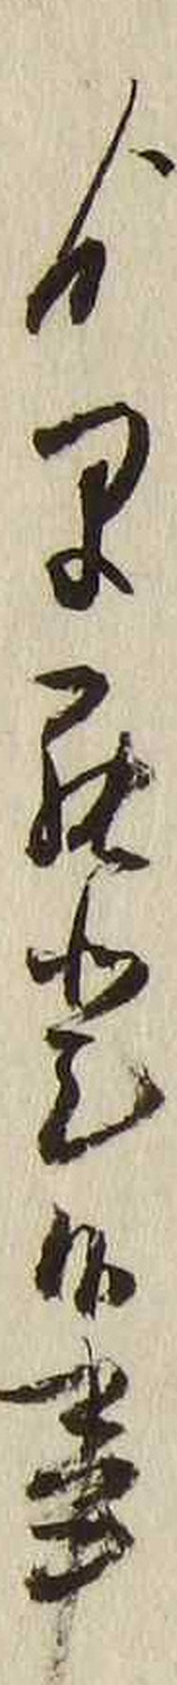ゟ早罷登候事

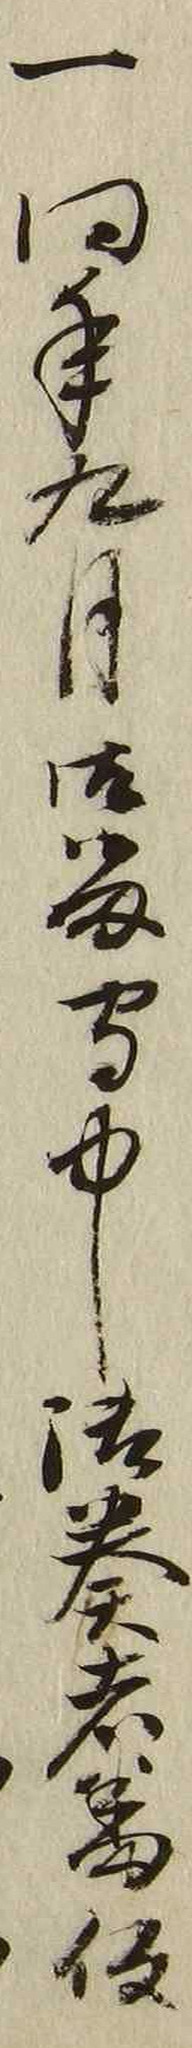一同年九月御留守中御奏者番仮
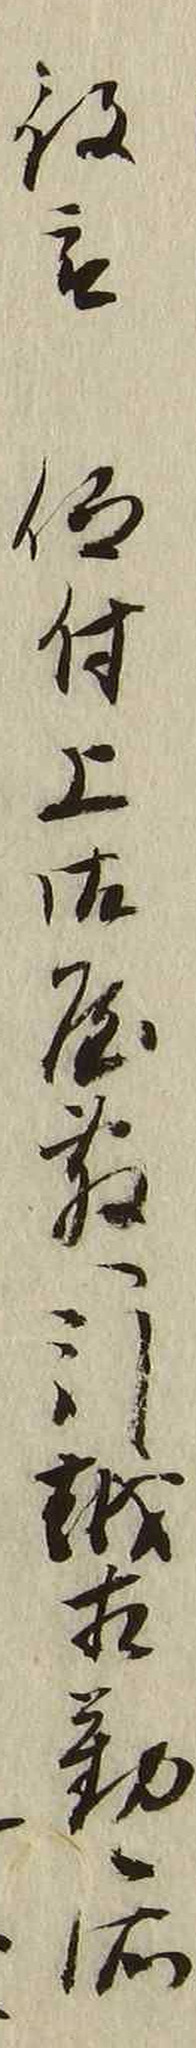役被仰付上御屋敷へ引越相勤候所
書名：諸士系譜　巻之348　も之部4
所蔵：会津若松市立会津図書館
